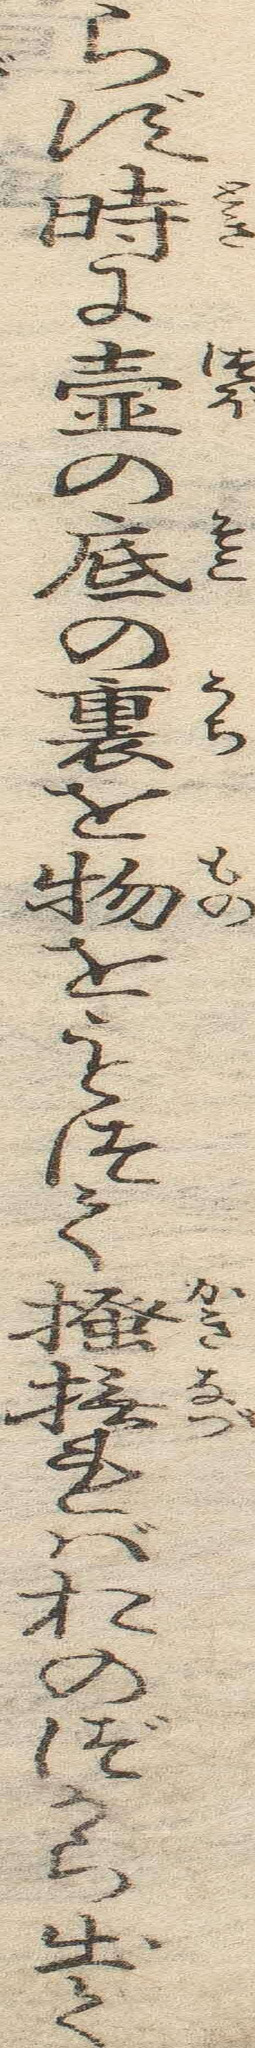らず時に壺の底の裏を物をもつて掻撫ればおのづから出て
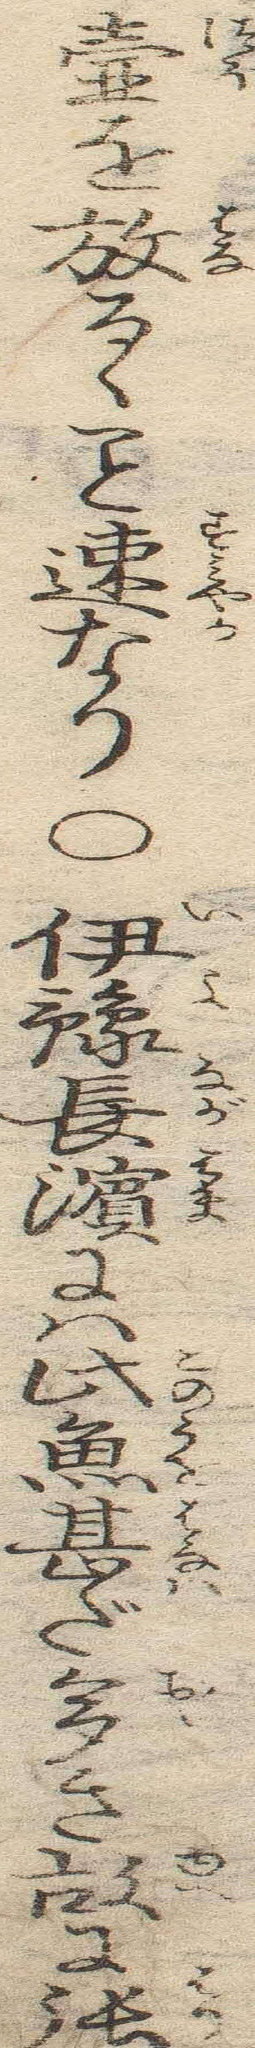壺を放るゝこと速なり○伊予長浜には此魚甚だ多き故に張
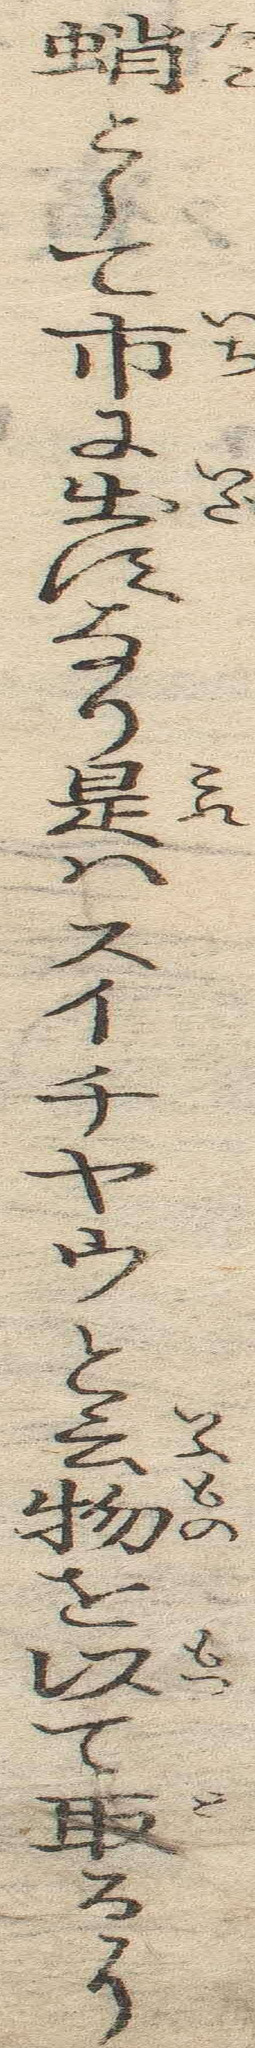蛸として市に出すなり是はスイチヤウと云物を以て取るに
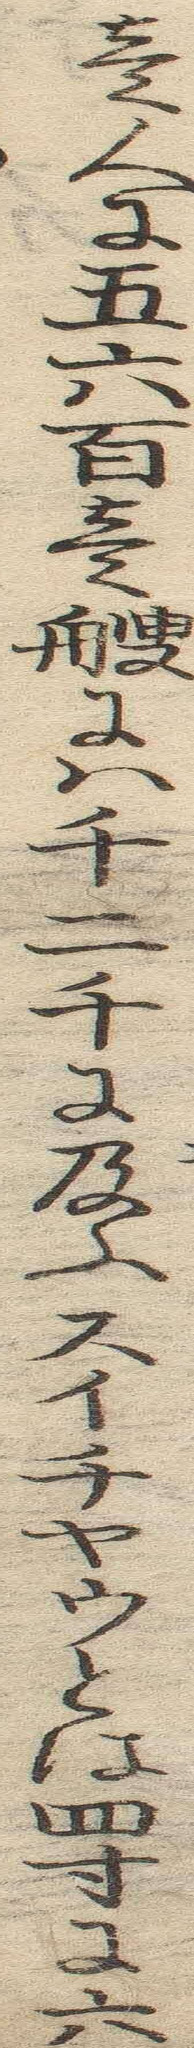壱人に五六百壱艘には千二千に及ふスイチヤウとは四寸に六

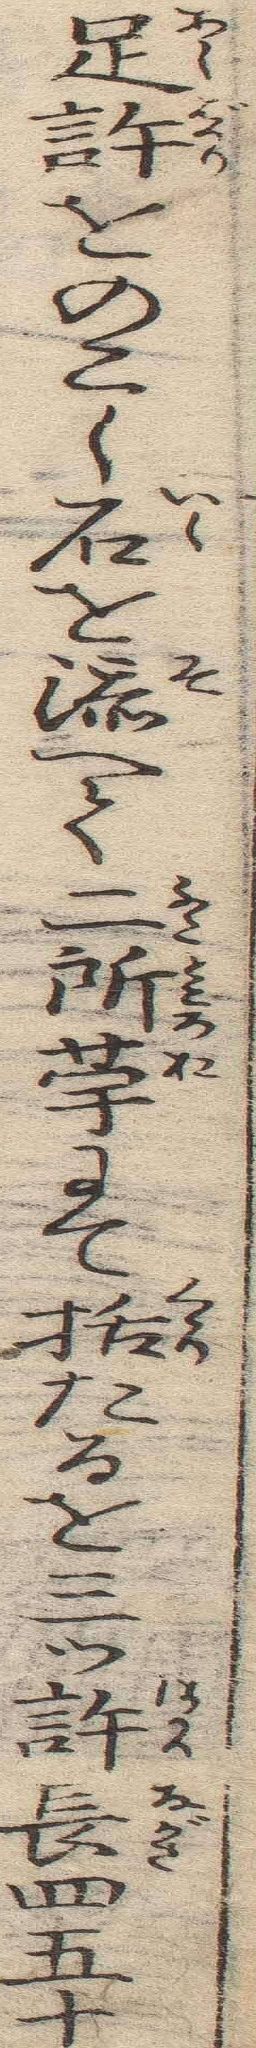足許をのこし石を添へて二所荢にて括たるを三つ許長四五十
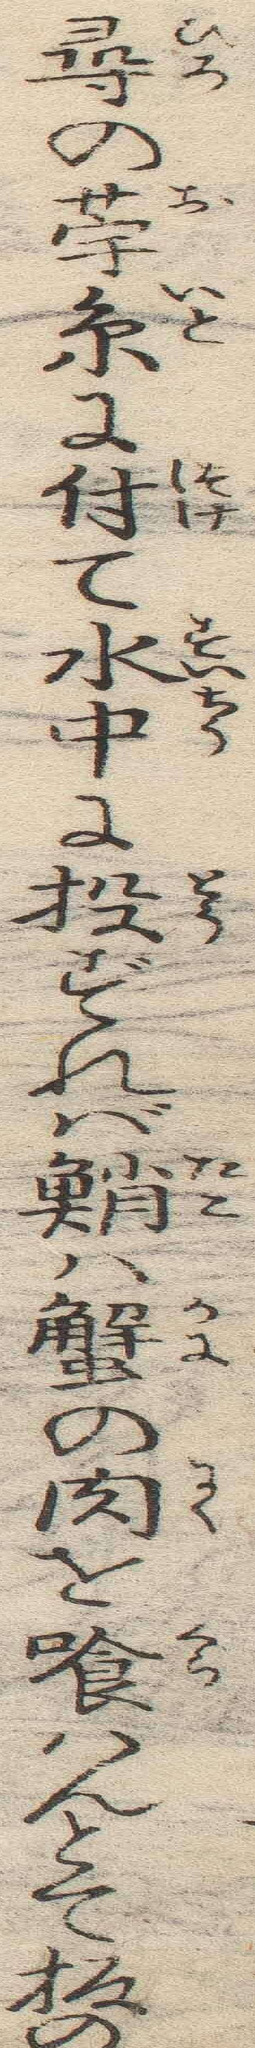尋の荢糸に付て水中に投ずれば鮹は蟹の肉を喰はんとて板の
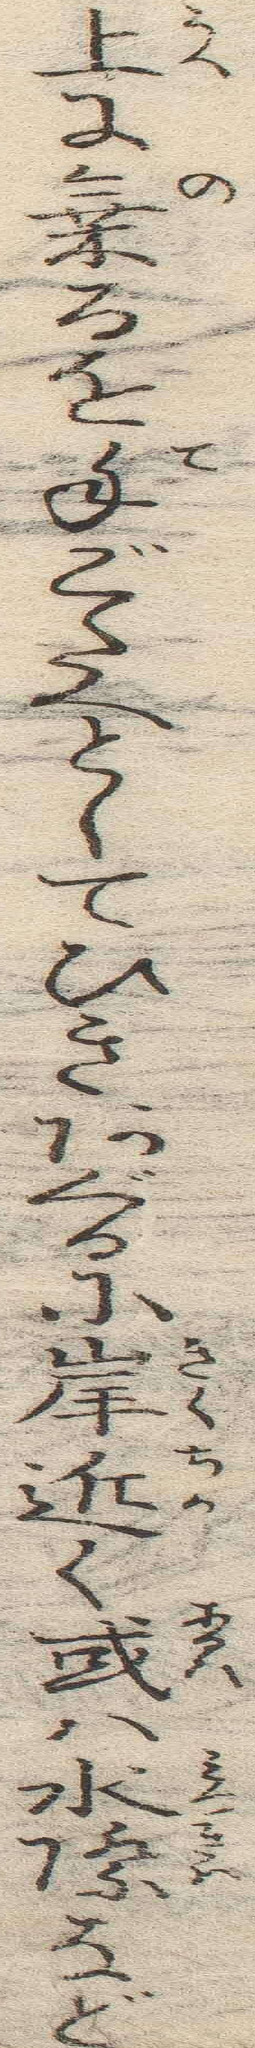上に乗るを手ごたへとしてひきあぐるに岸近く或は水際など
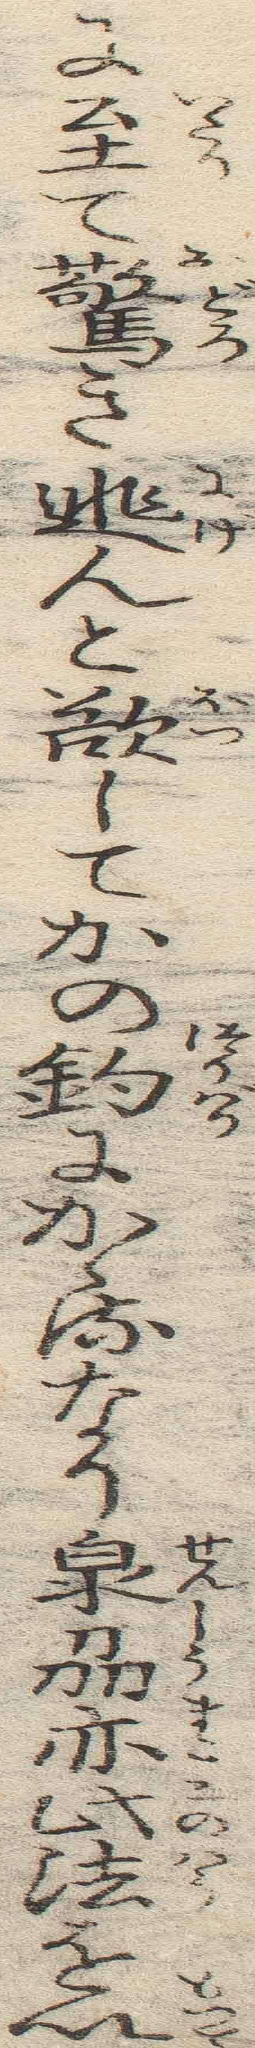に至て驚き逃んと欲してかの釣にかゝるなり泉州亦此法を以
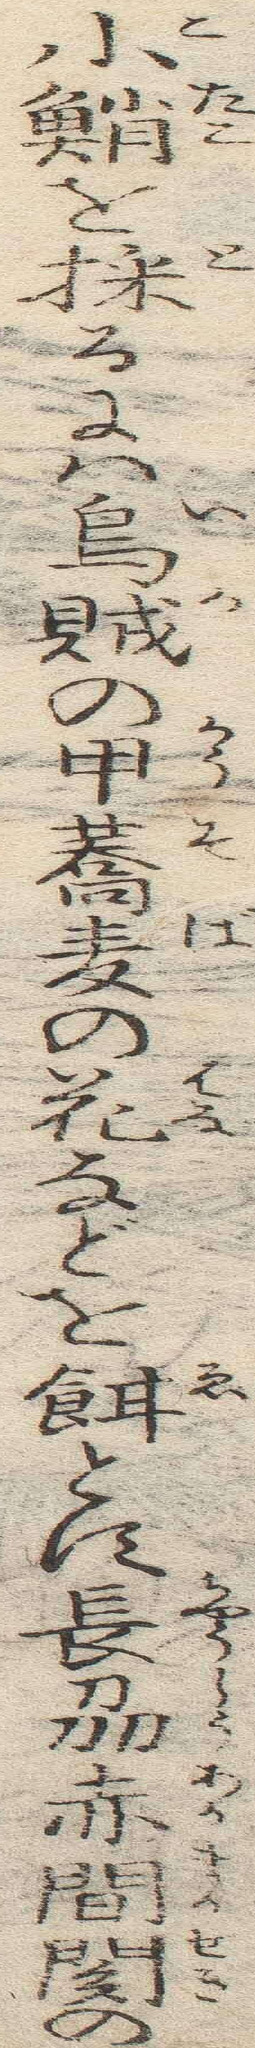小鮹を採るには烏賊の甲蕎麦の花などを餌とす長州赤間関の
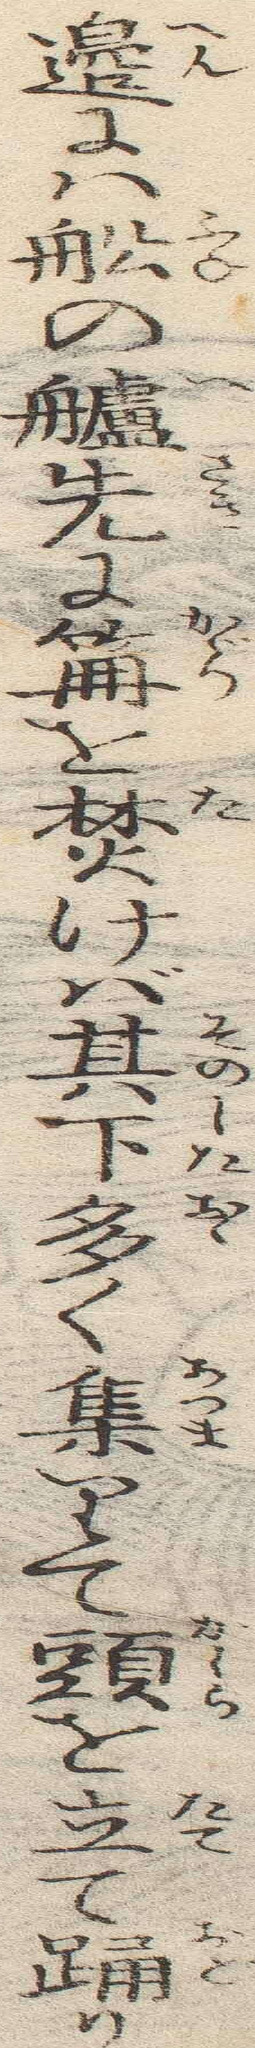辺には船の艫先に篝を焚けば其下多く集りて頭を立て踊り
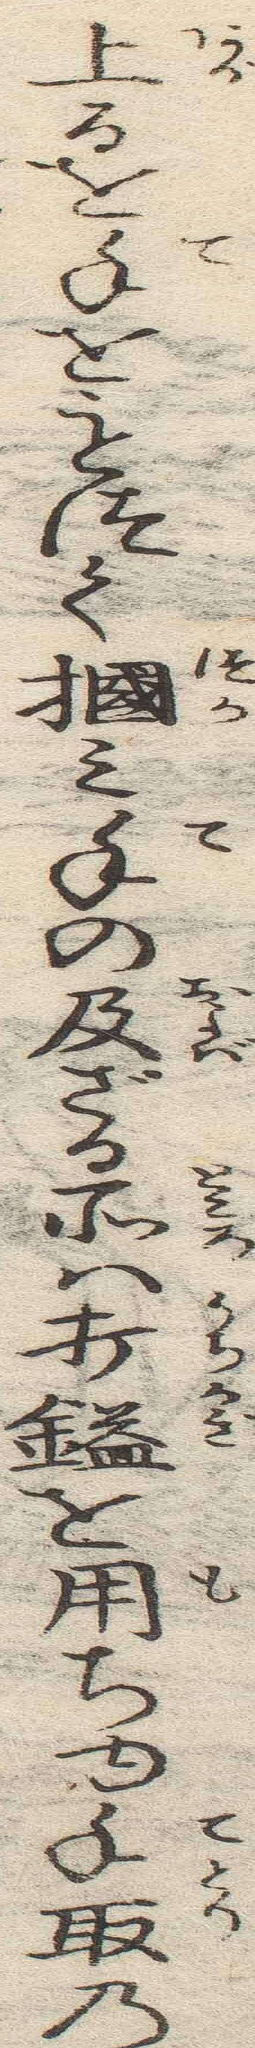上るを手をもつて掴み手の及ざる所は打鎰を用ちゆ手取の
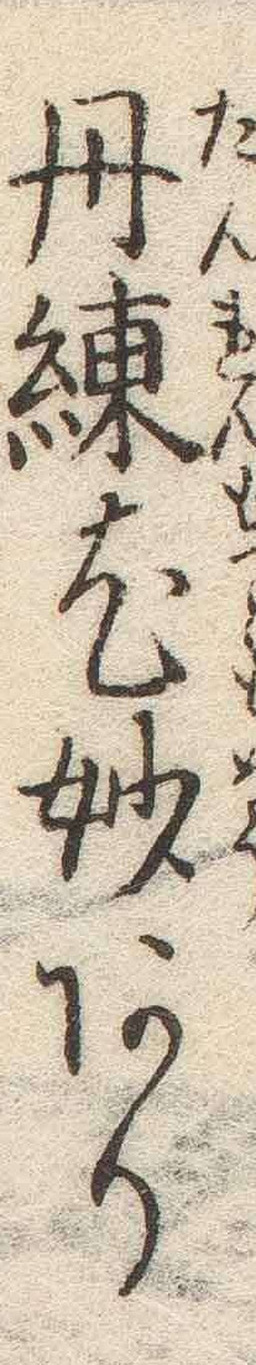丹練尤妙あり
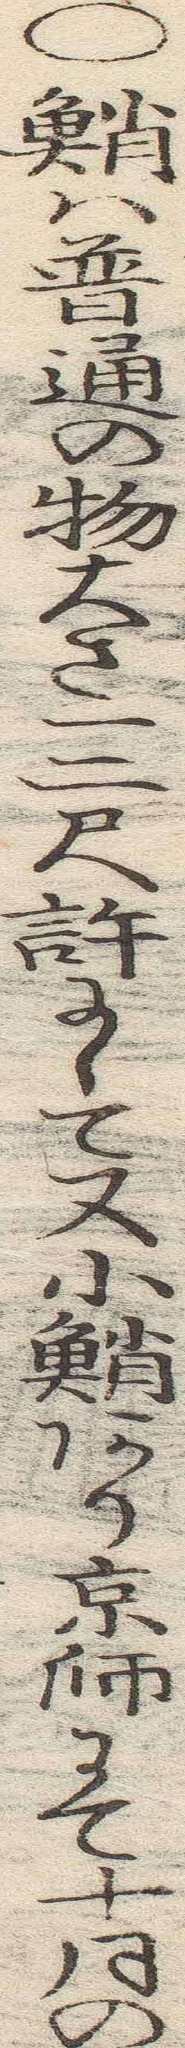○鮹は普通の物大さ一二尺許にして又小鮹あり京師にて十月の
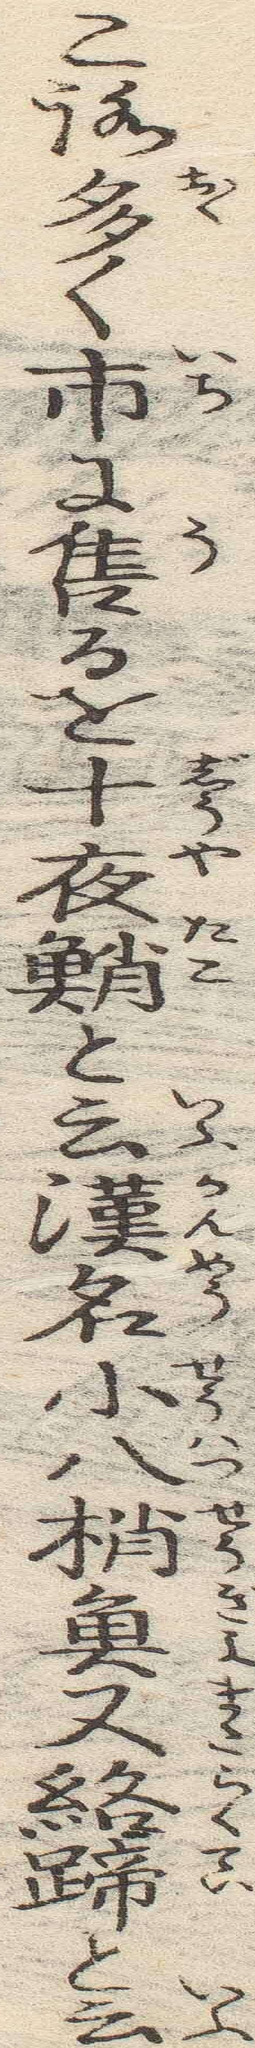ころ多く市に售るを十夜鮹と云漢名小八梢魚又絡蹄と云
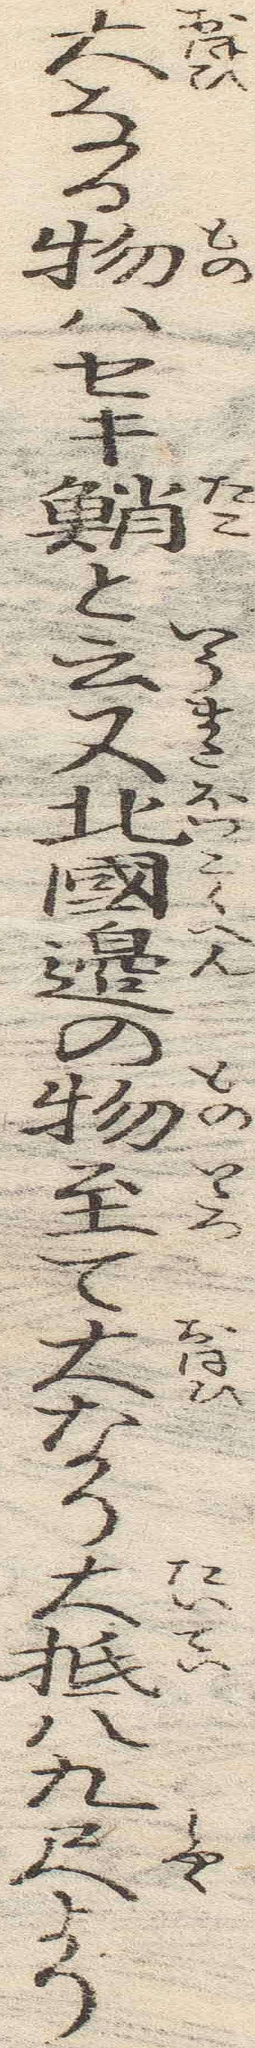大なる物はセキ鮹と云又北国辺の物至て大なり大抵八九尺より
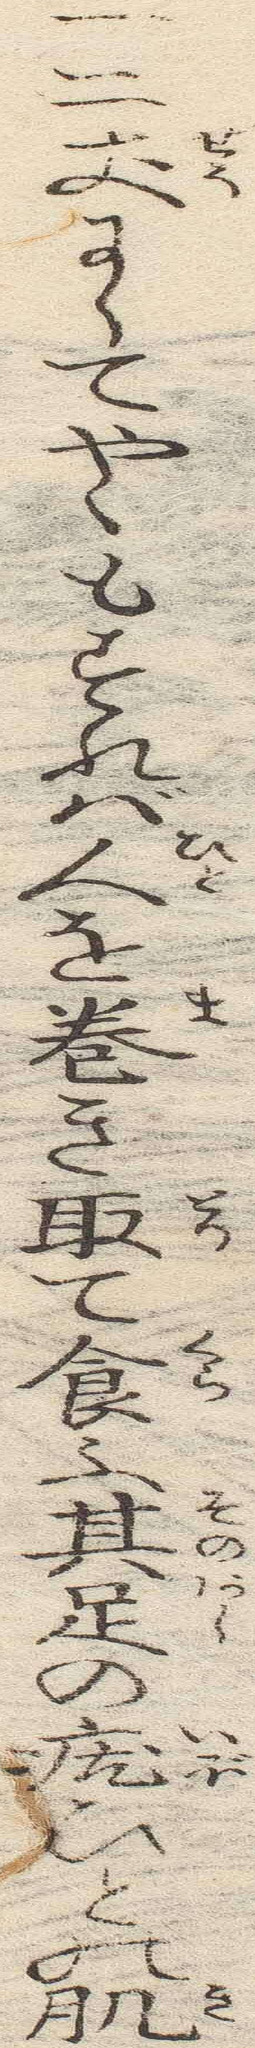一二丈にしてやゝもすれば人を巻き取て食ふ其足の疣ひとの肌
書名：日本山海名産図会
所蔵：東京学芸大学附属図書館 国文学研究資料館
